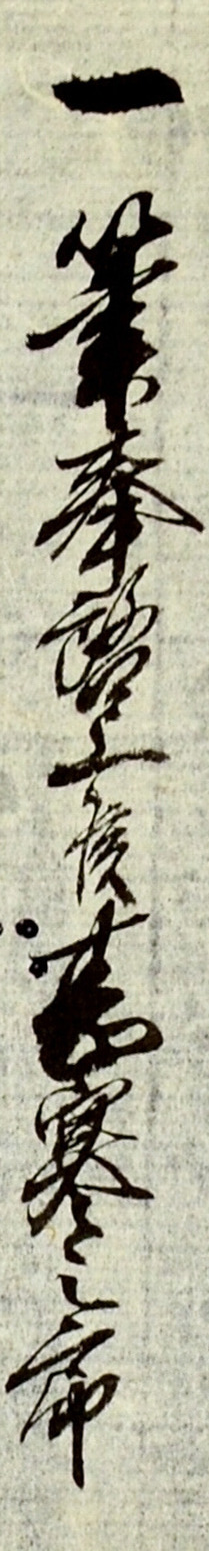一筆奉啓上候甚寒之節
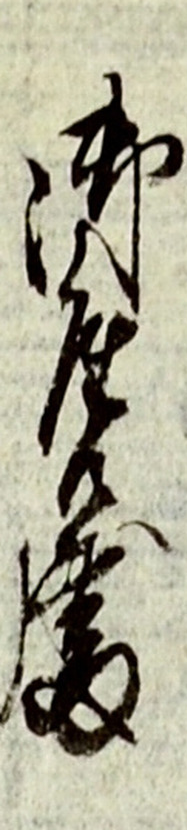御座候処
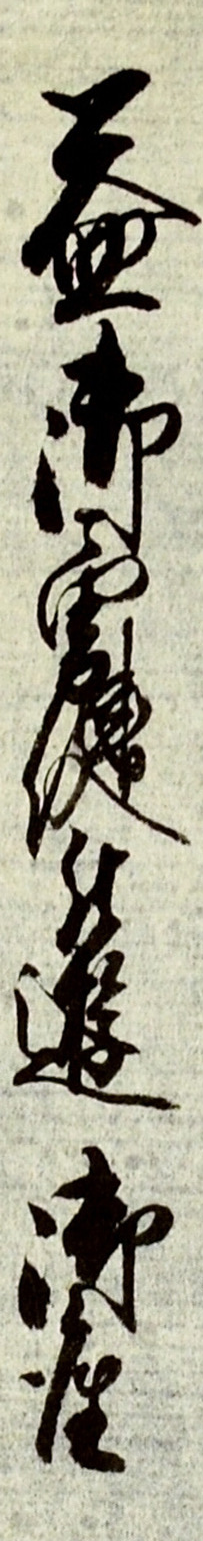益御勇健被遊御座
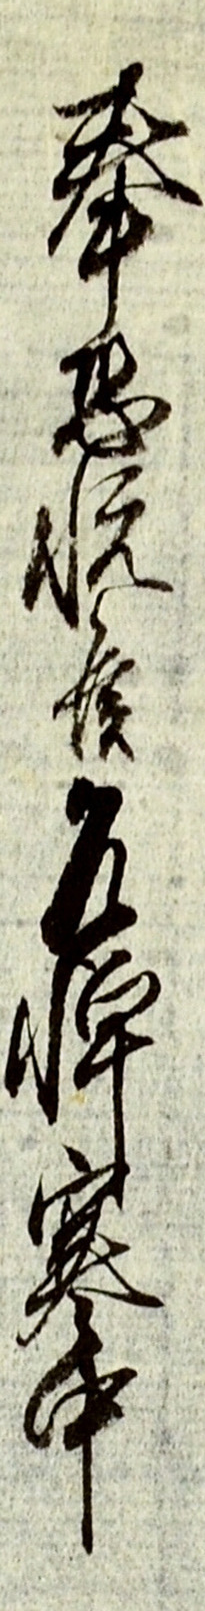奉恐悦候乍憚寒中
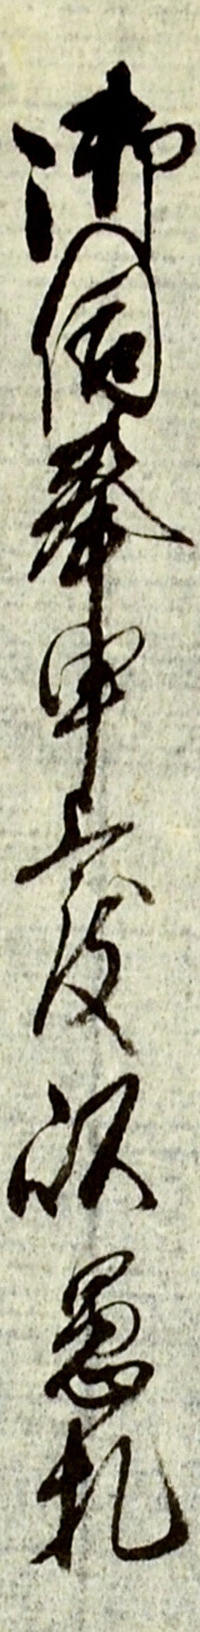御伺奉申上度以愚札
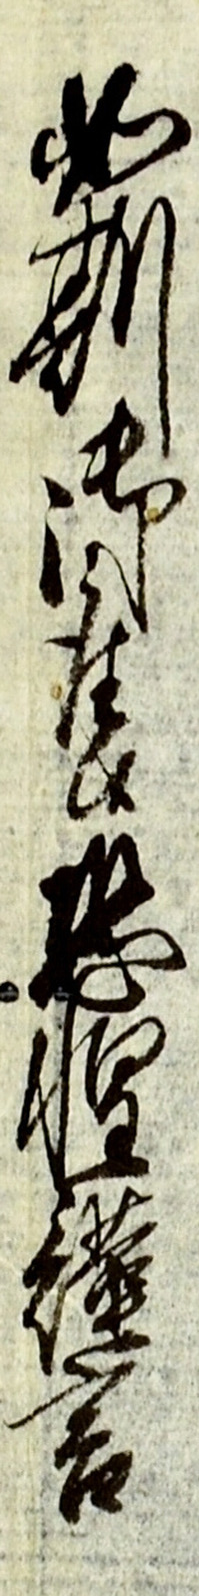如斯御座候恐惶謹言
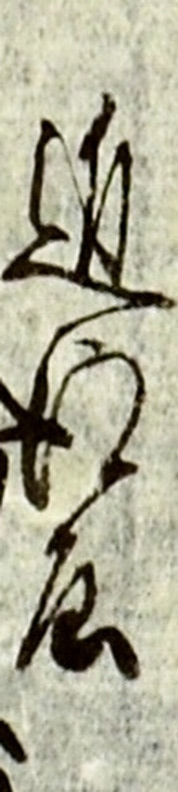近江屋
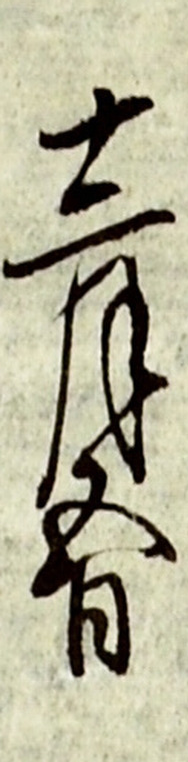十二月五日
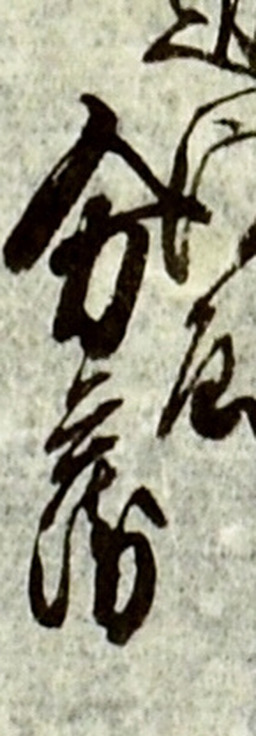分兵衛
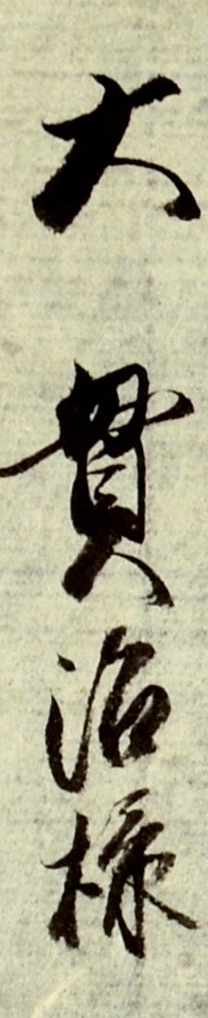大貫治様
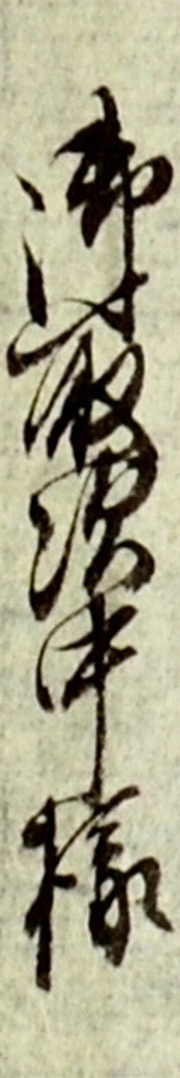御取次中様
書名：書状
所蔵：伊那市立高遠町図書館・合同会社AMANE
